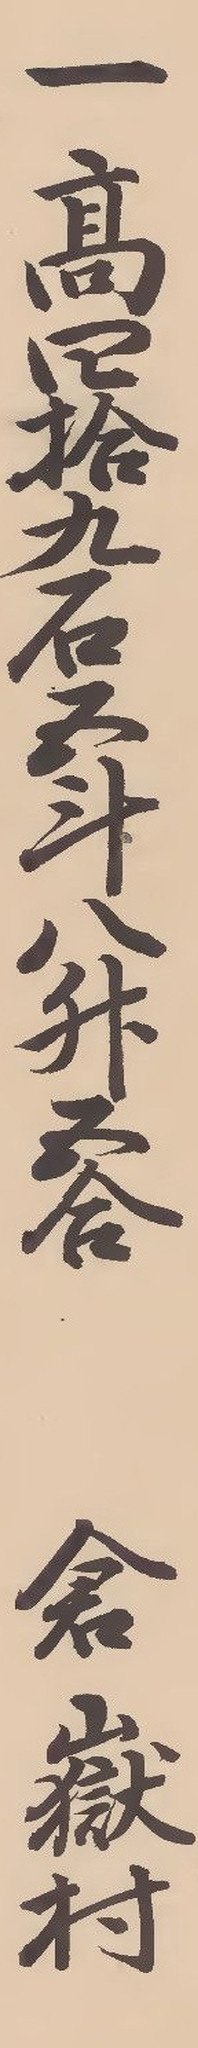一高四拾九石五斗八升五合倉嶽村
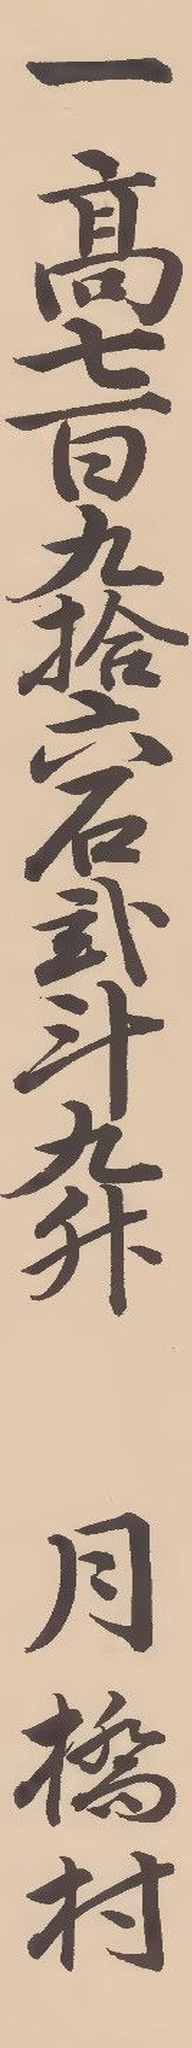一高七百九拾六石弐斗九升月橋村

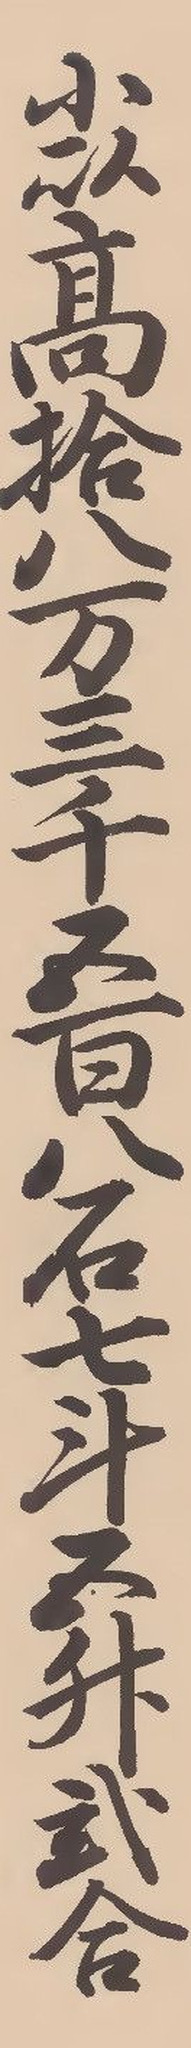小以高拾八万三千五百八石七斗五升弐合

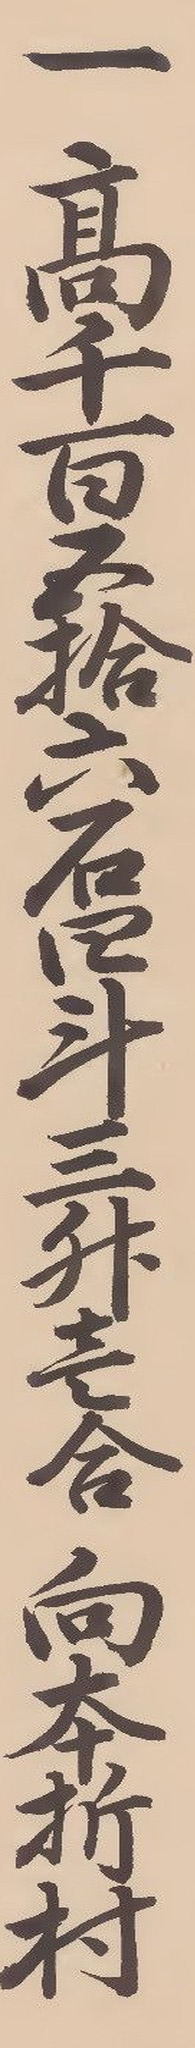一高千百五拾六石四斗三升壱合向本折村
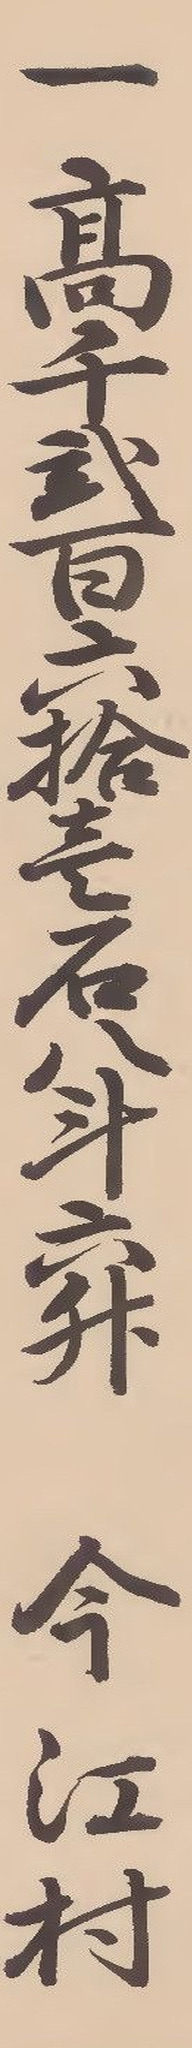一高千弐百六拾壱石八斗六升今江村
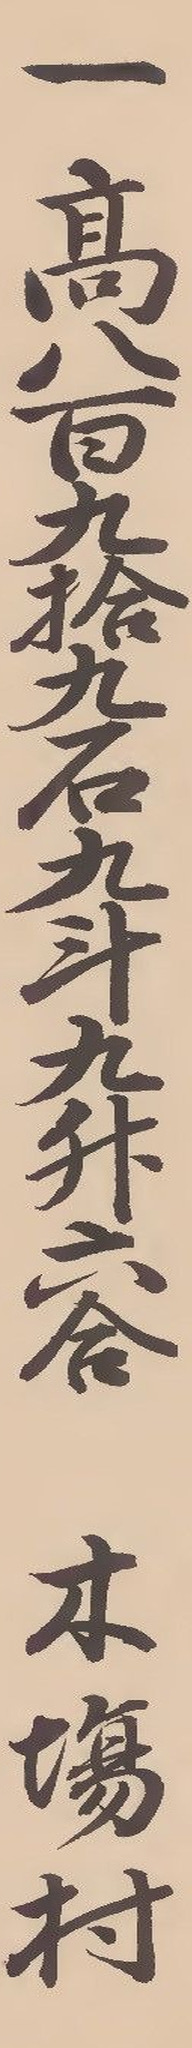一高八百九拾九石九斗九升六合木場村
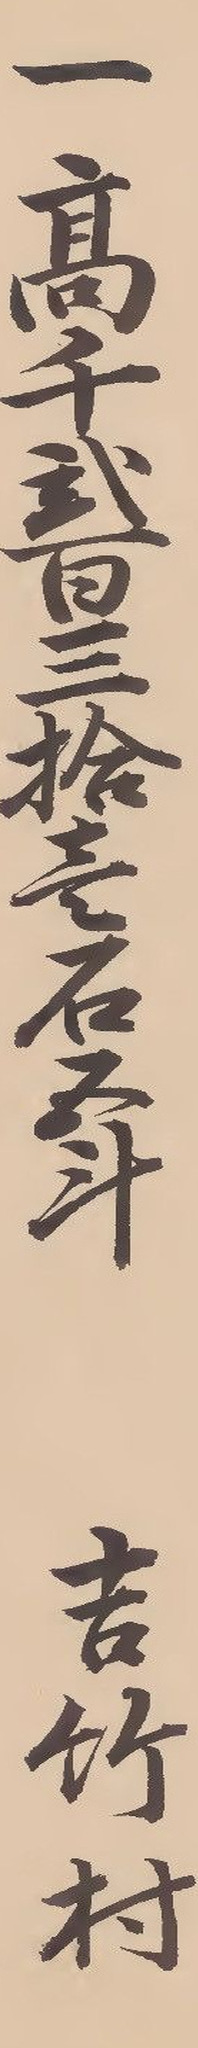一高千弐百三拾壱石五斗吉竹村

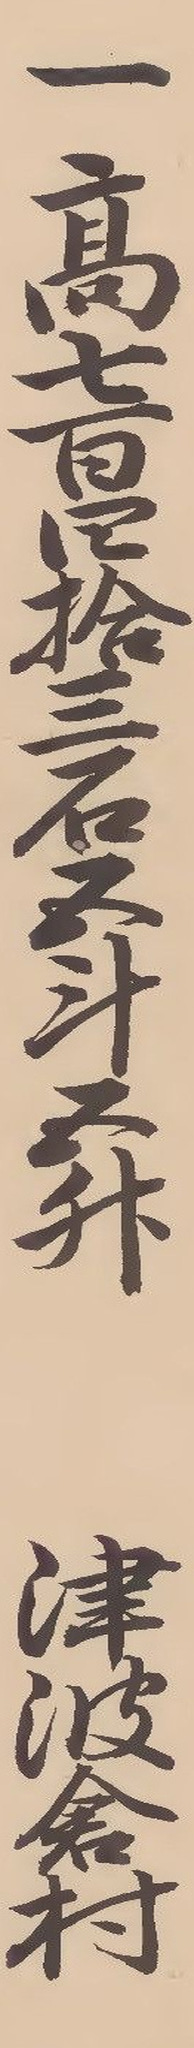一高七百四拾三石五斗五升津波倉村
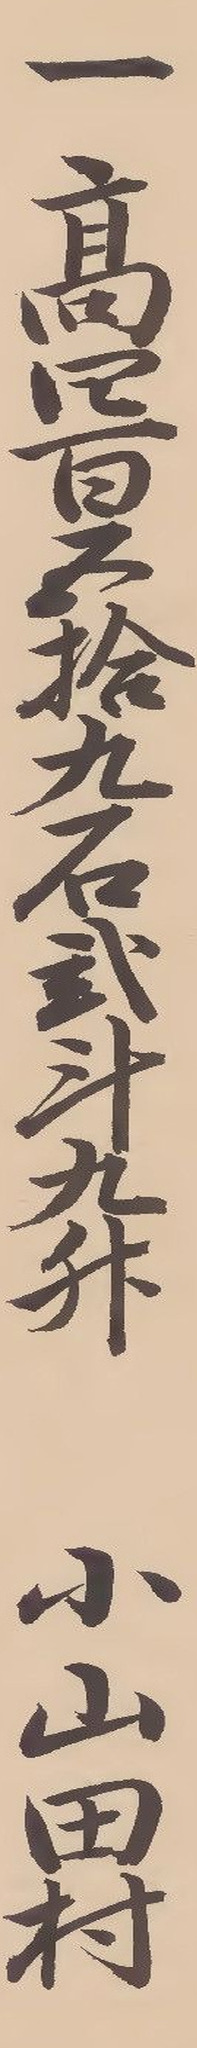一高四百五拾九石弐斗九升小山田村
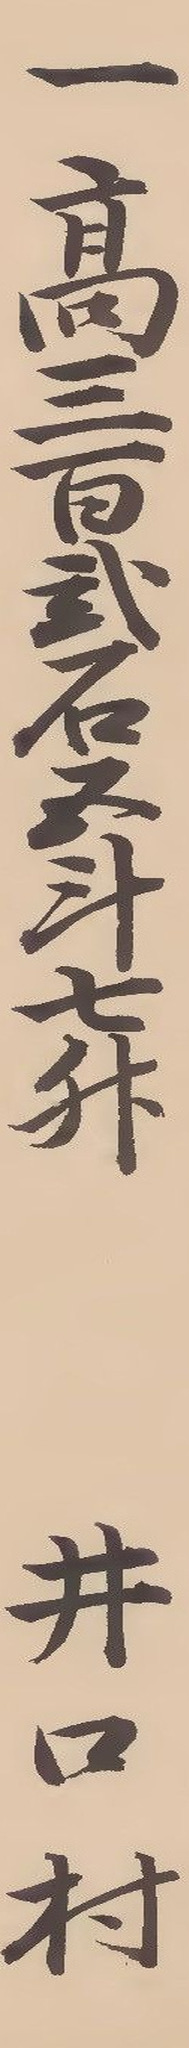一高三百弐石五斗七升井口村
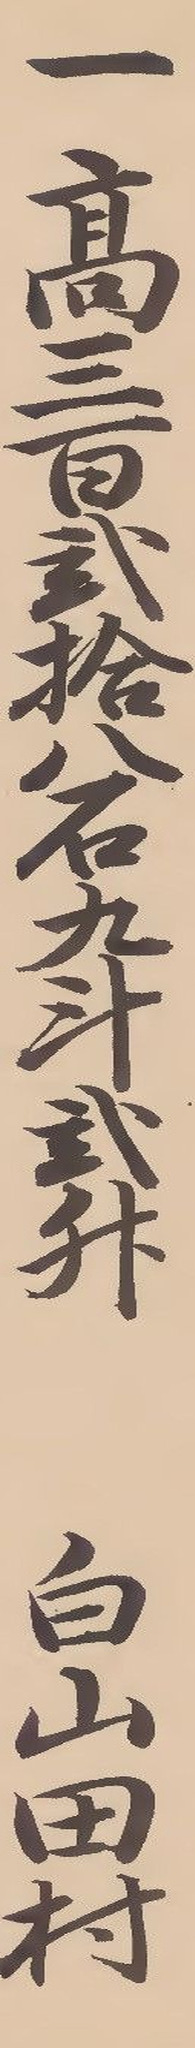一高三百弐拾八石九斗弐升白山田村
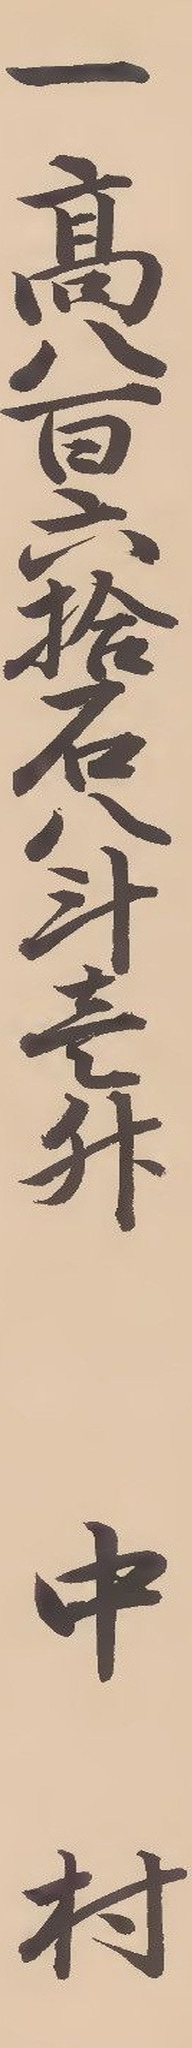一高八百六拾石八斗壱升中村
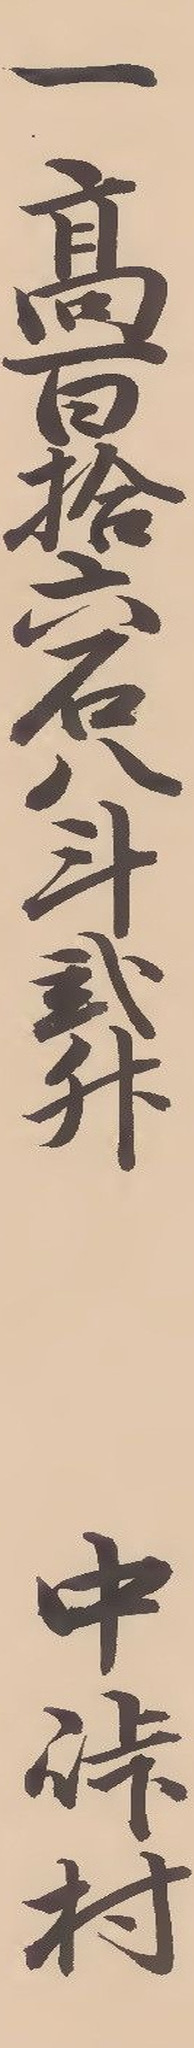一高百拾六石八斗弐升中峠村
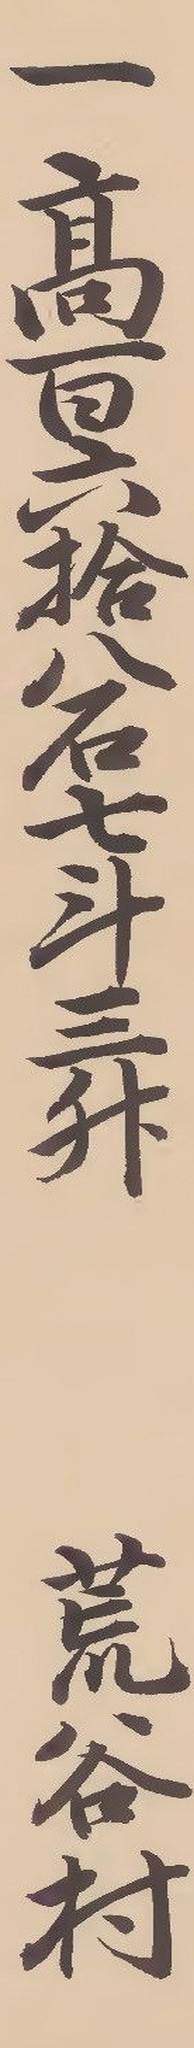一高百六拾八石七斗三升荒谷村
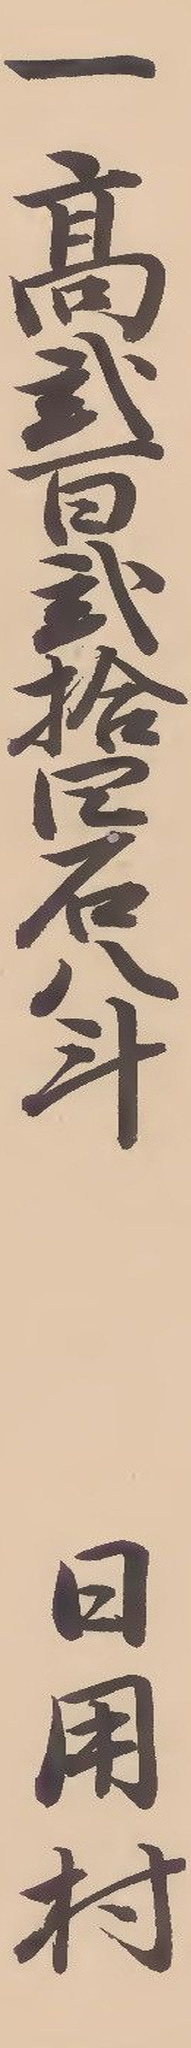一高弐百弐拾四石八斗日用村

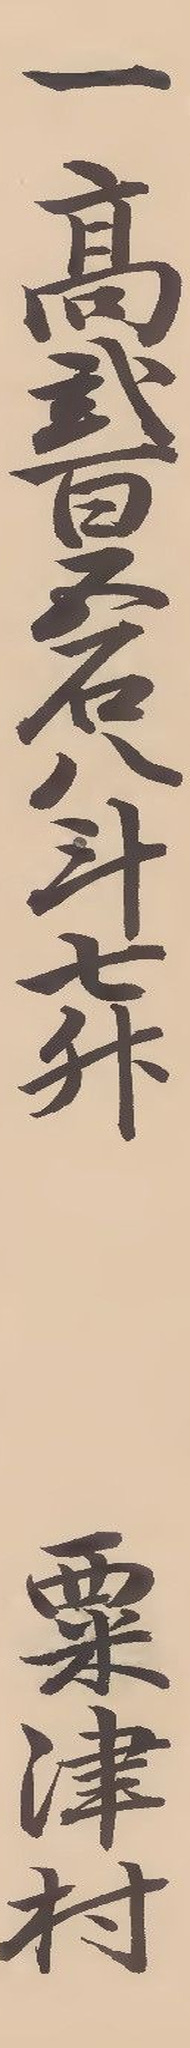一高弐百五石八斗七升粟津村
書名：加賀国郷帳
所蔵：国立公文書館 National Archives of Japan
